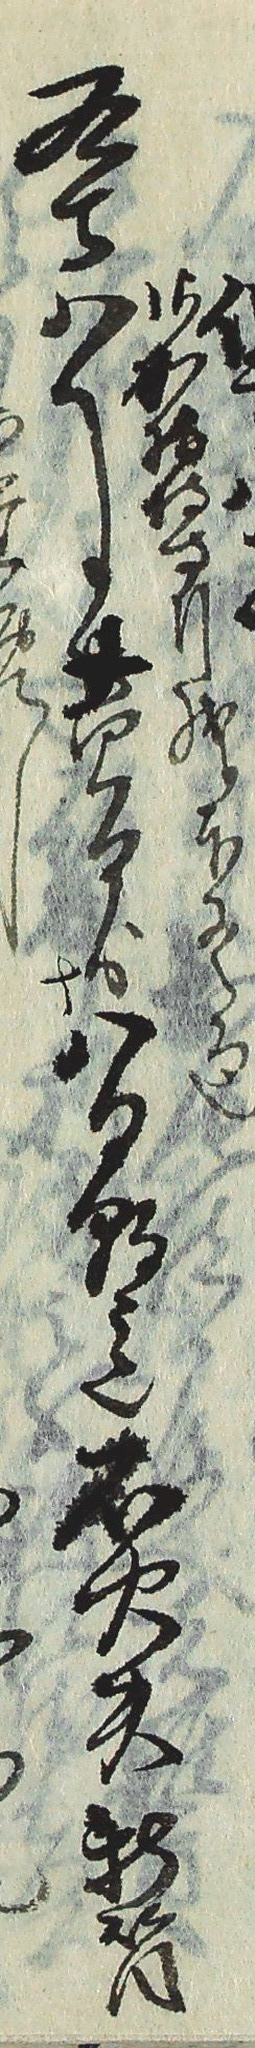右は八月十四日ゟ十八日朝迄石火矢新筒
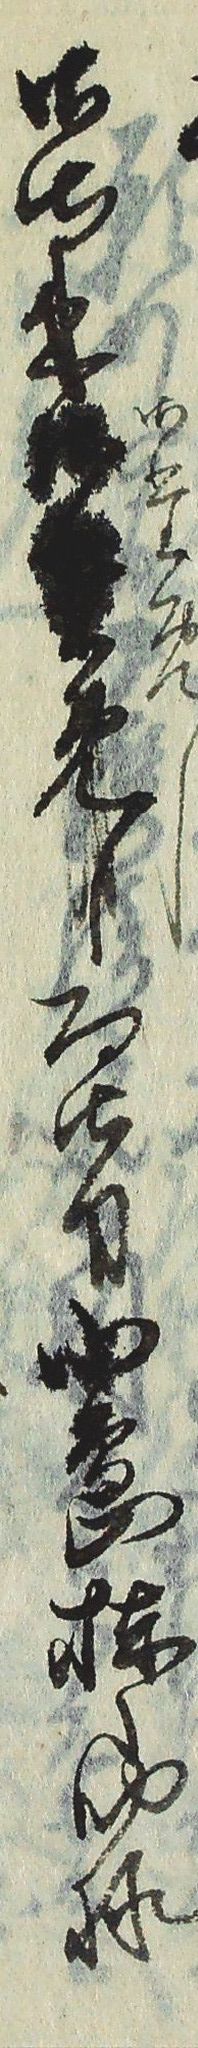御出来御ためし為御用北島棟之助様
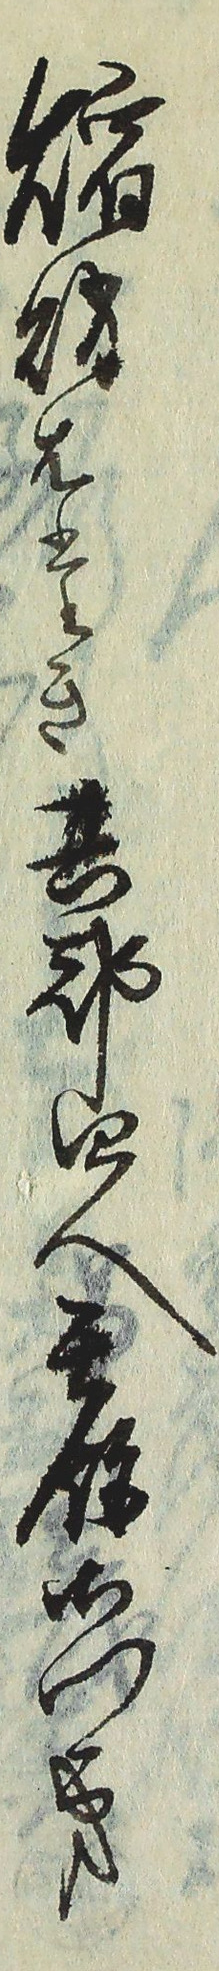焔硝はたき其郡四人其余御門弟
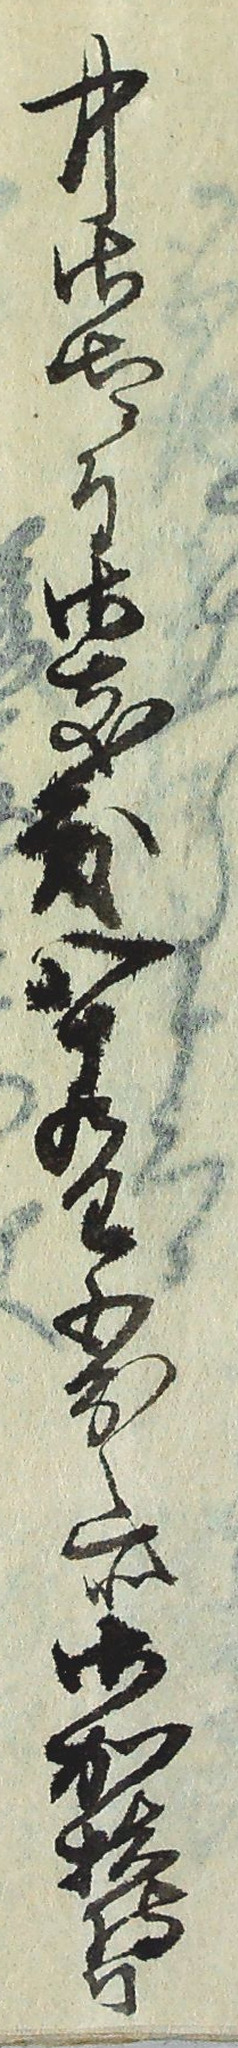中御出に付御支度八十九匁五分之所御加扶持引
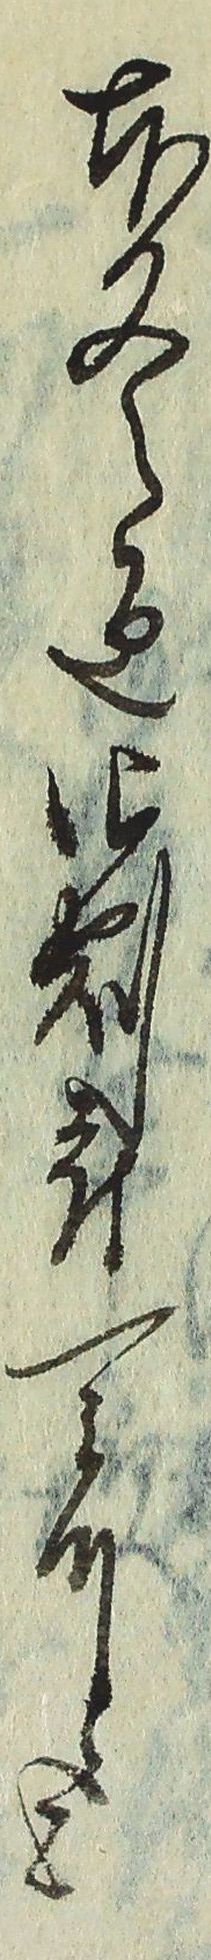本文之通御割苻可被下候以上
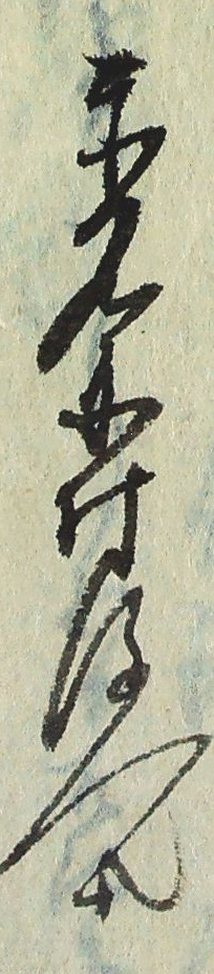東名東村役人共
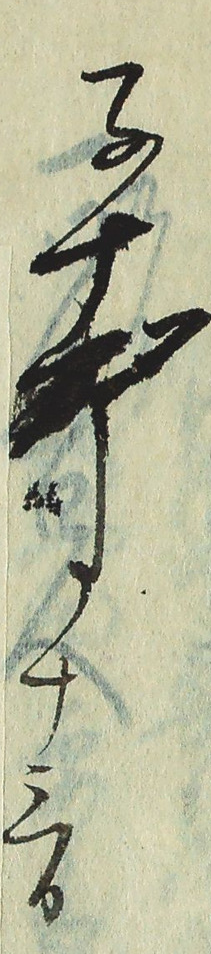子十一月十三日
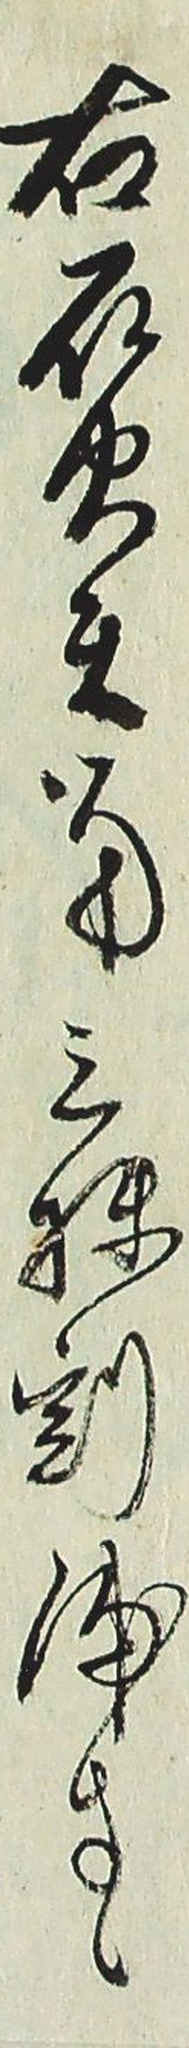右石火矢御用三株割浦方へ
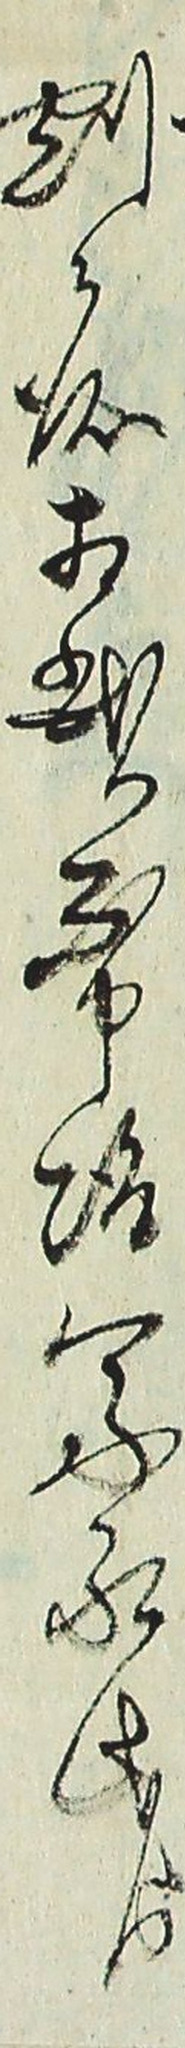割候所相当り不申趣富永氏ゟ
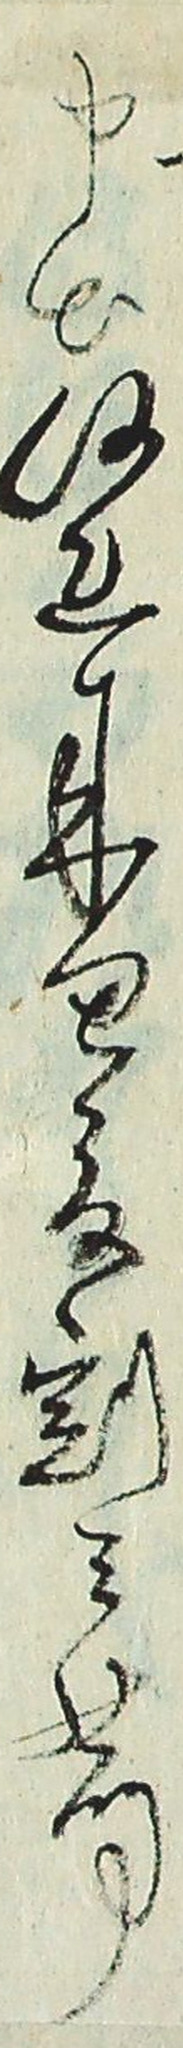申出何れ来丑夏割之節
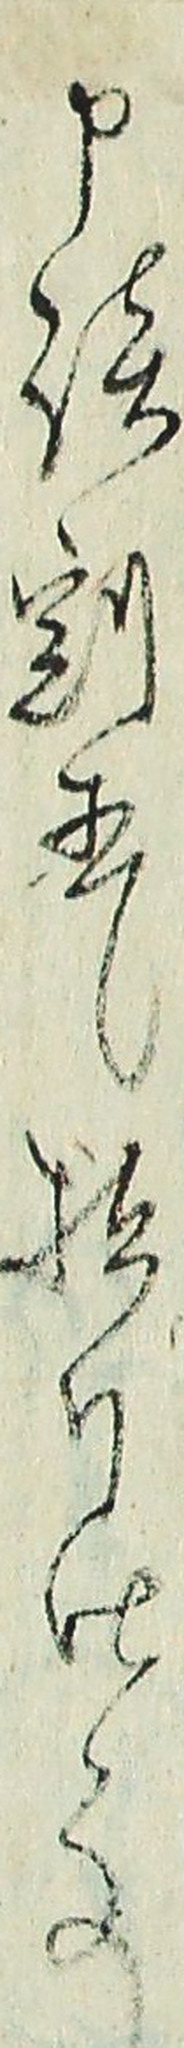申談割直し指引仕候事

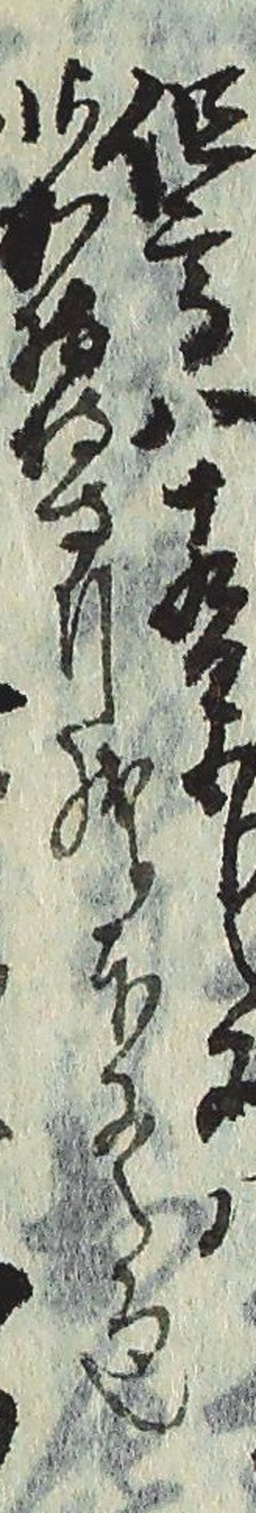御加扶持方引残り本文之通
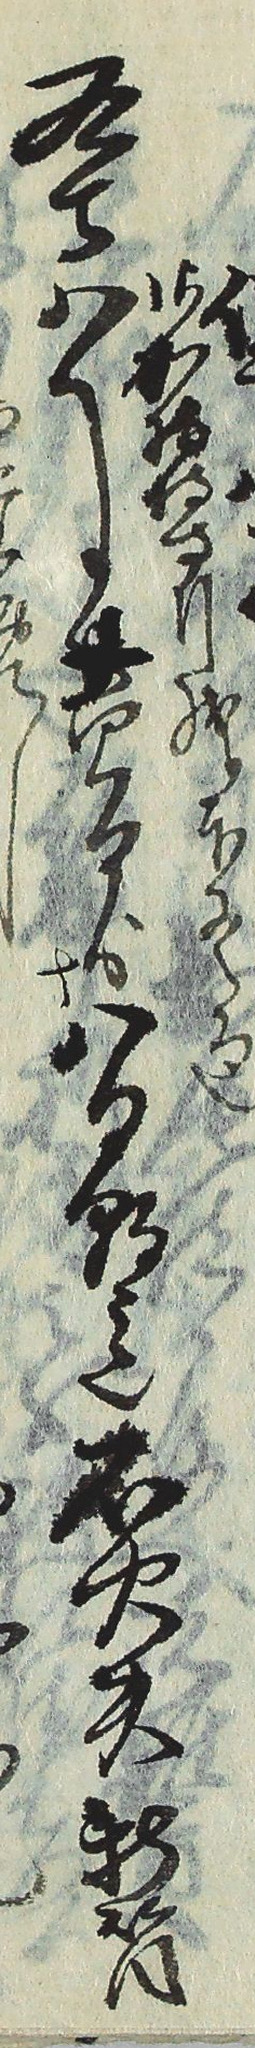右は八月十四日ゟ十八日朝迄石火矢新筒
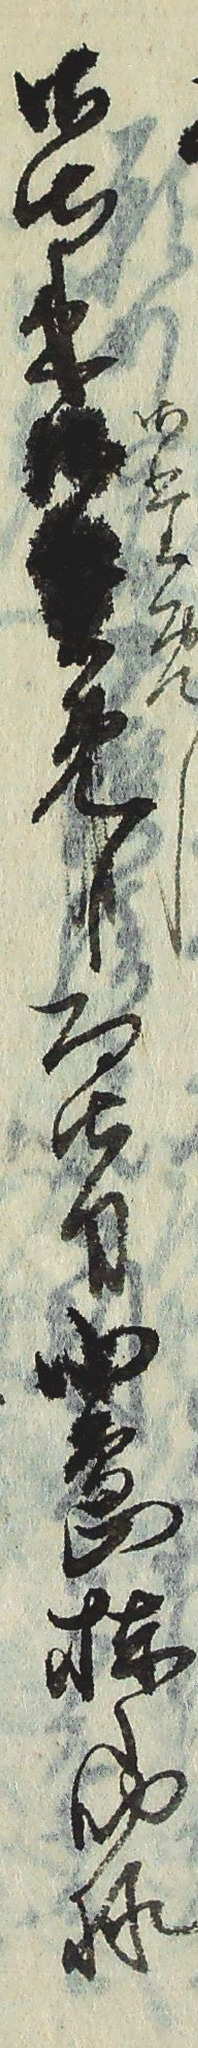御出来御ためし為御用北島棟之助様
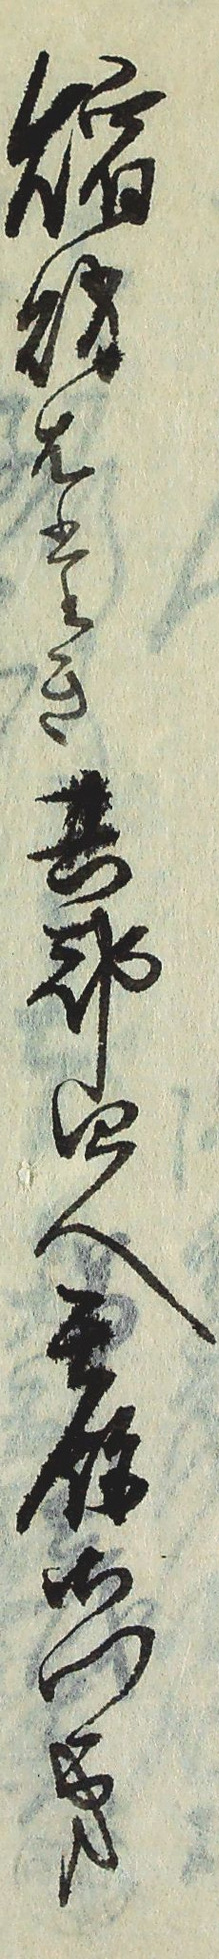焔硝はたき其郡四人其余御門弟
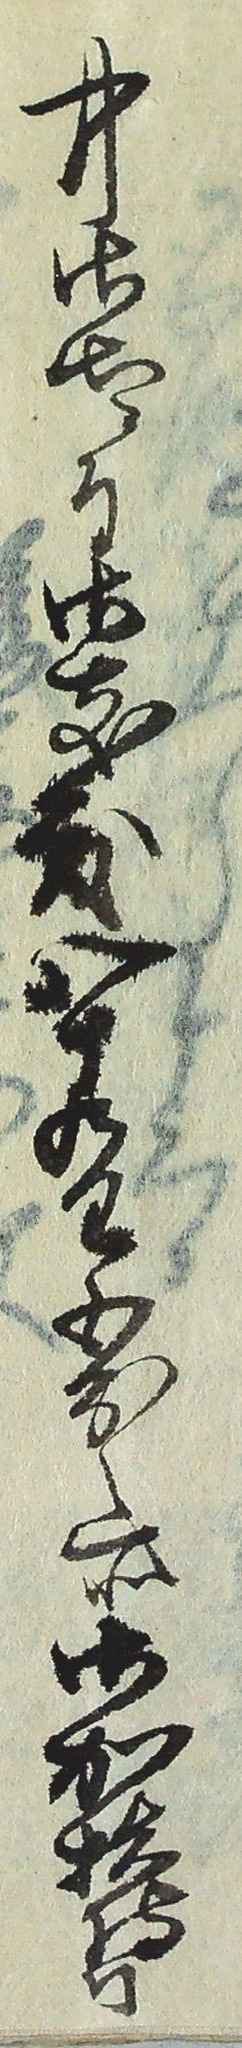中御出に付御支度八十九匁五分之所御加枝持引
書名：名東郡中諸割賦元帳
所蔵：鳴門教育大学 Naruto University of Education
